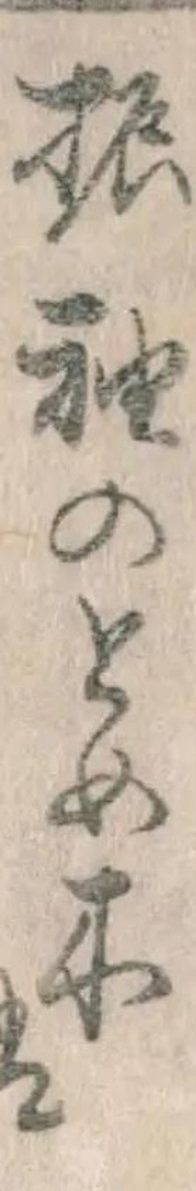振袖のとめ木は
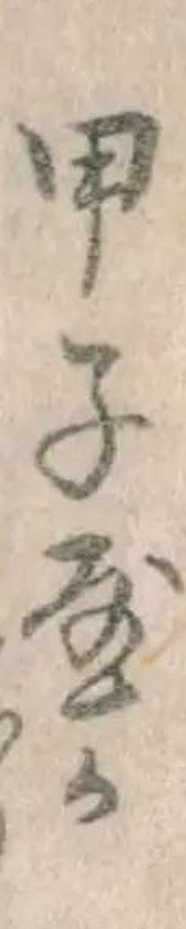甲子屋か
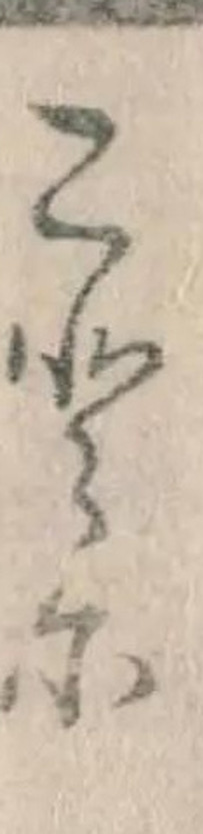ことに
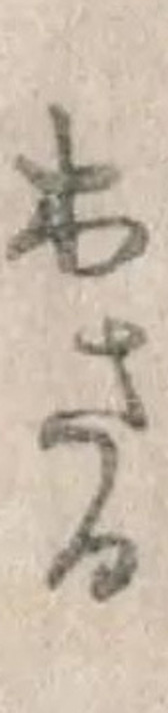出さる
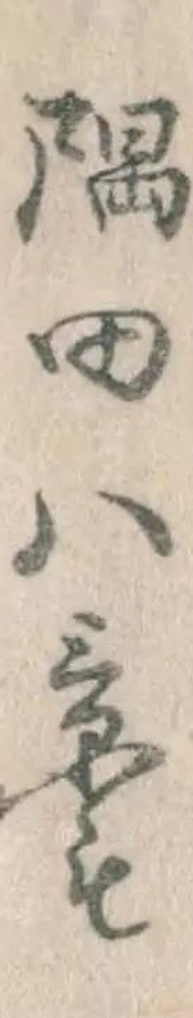隅田八景も
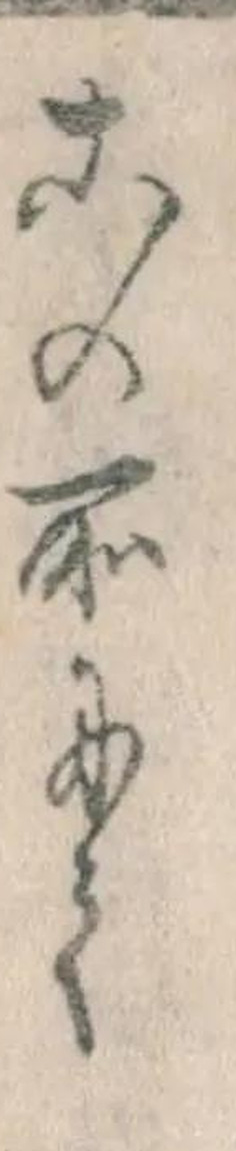この所にて
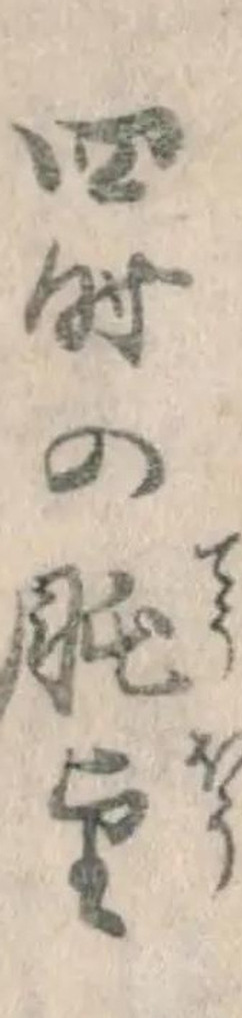四時の眺望
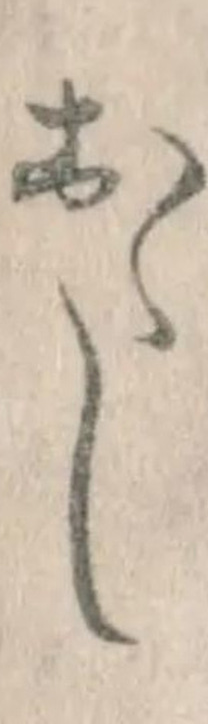おゝし

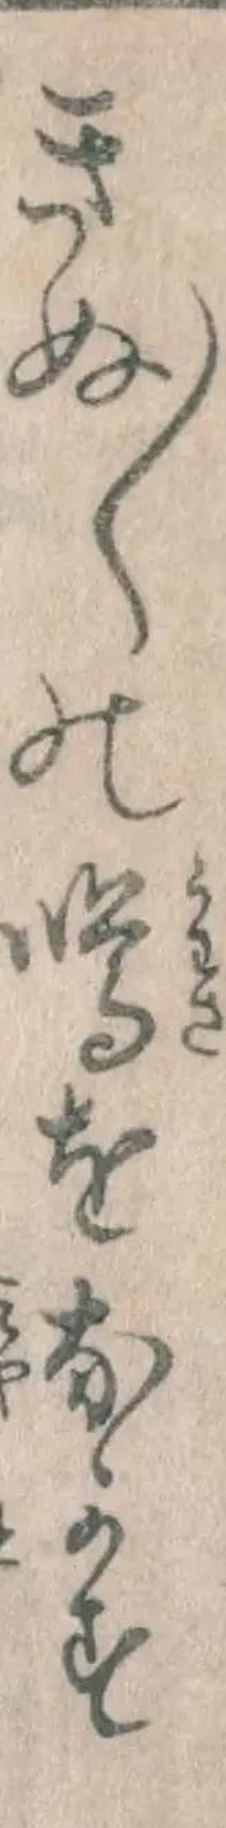きぬ〳〵の噂をなかす
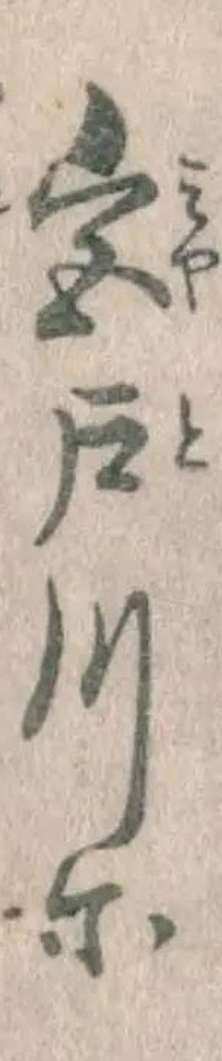宮戸川に
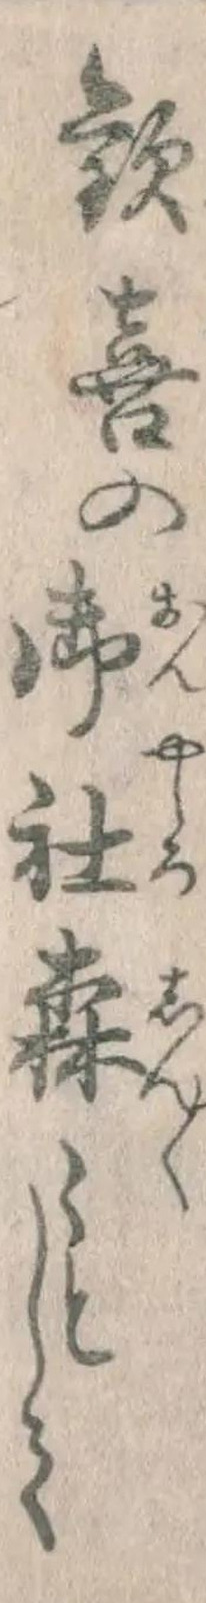歓喜の御社森〻として
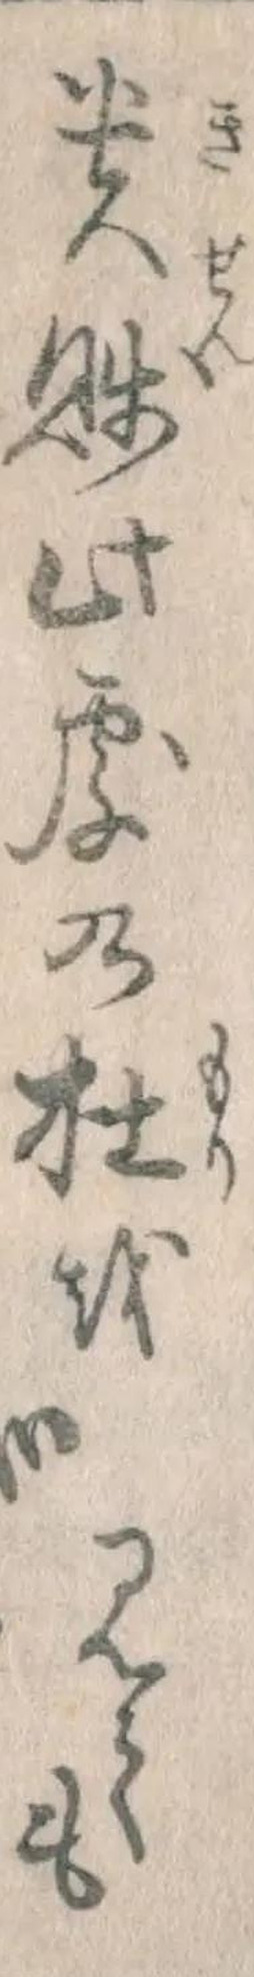貴賤此処の杜を見ても
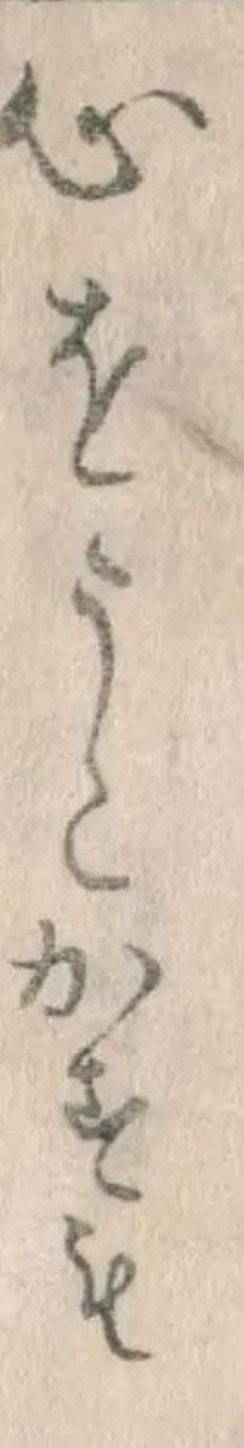心をうこかすも
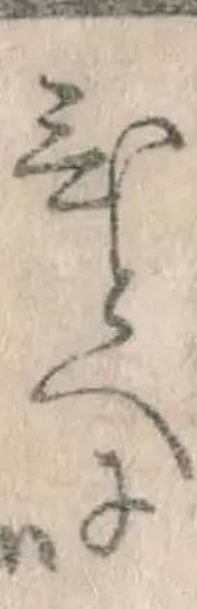ひとへに
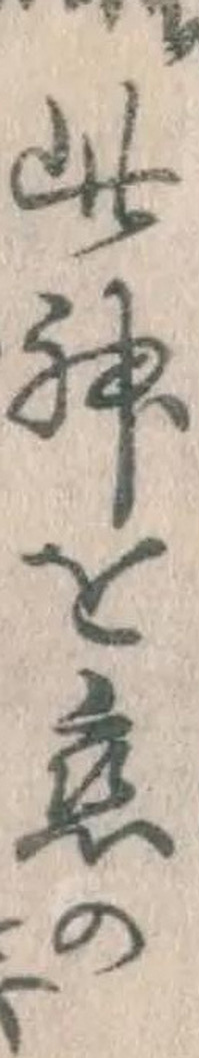此神を恋の
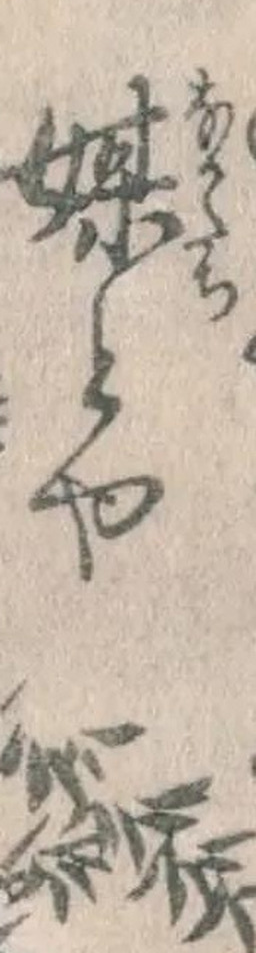媒とや
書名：絵本物見岡
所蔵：国立国会図書館 National Diet Library, JAPAN
